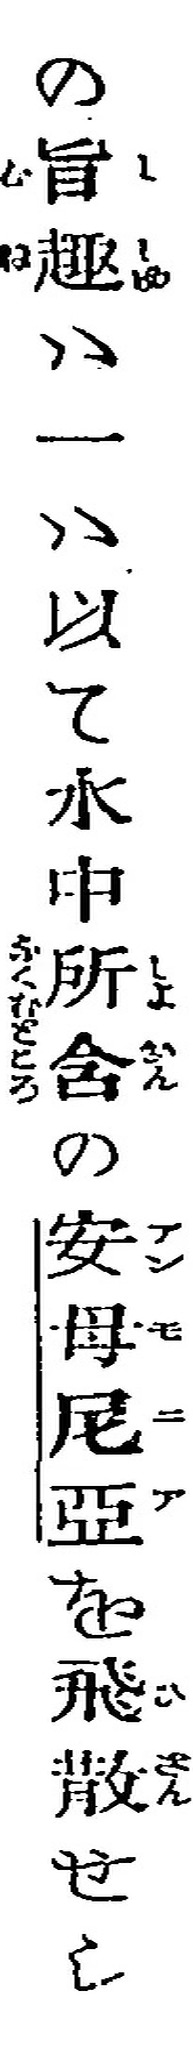の旨趣は一は以て水中所含の安母尼亞を飛散せし
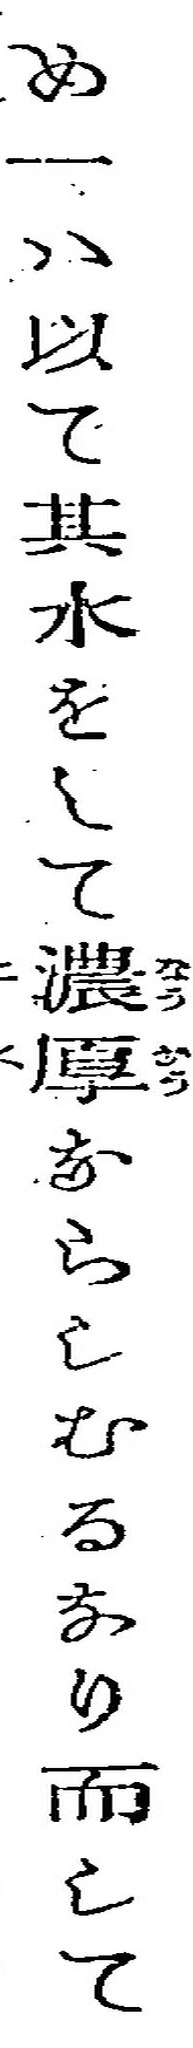め一は以て其水をして濃厚ならしむるなり而して
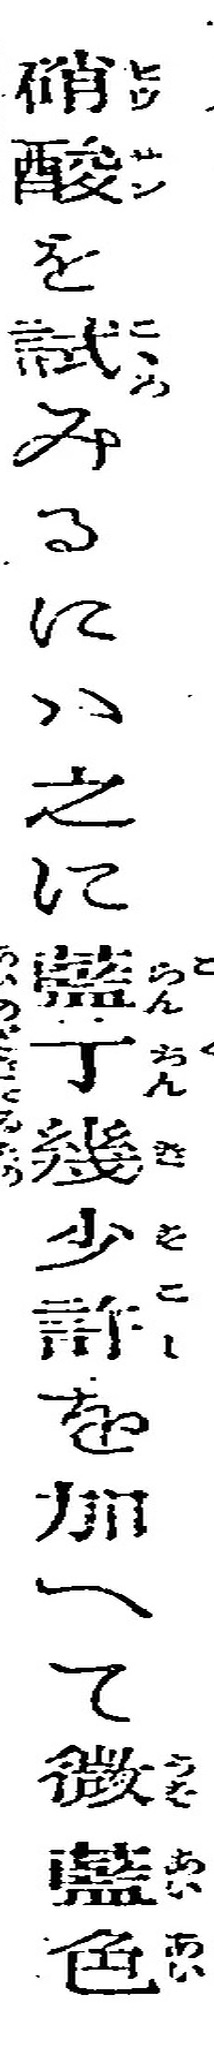硝酸を試みるには之に藍丁幾少許を加へて微藍色
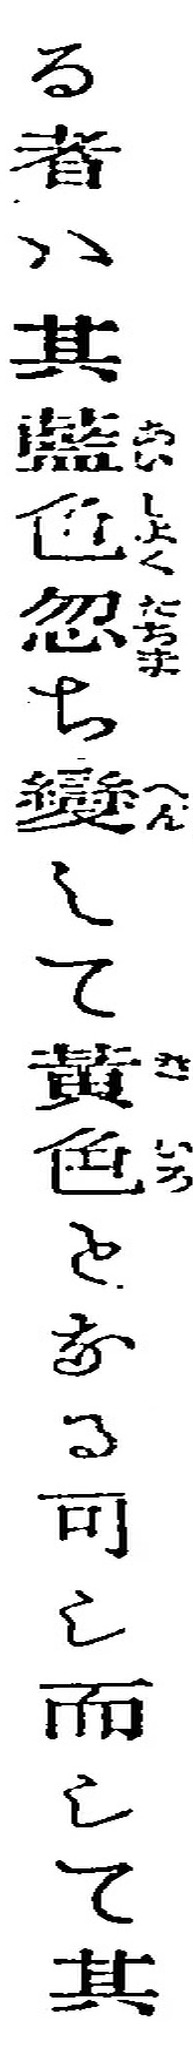る者は其藍色忽ち變して黄色となる可し而して其
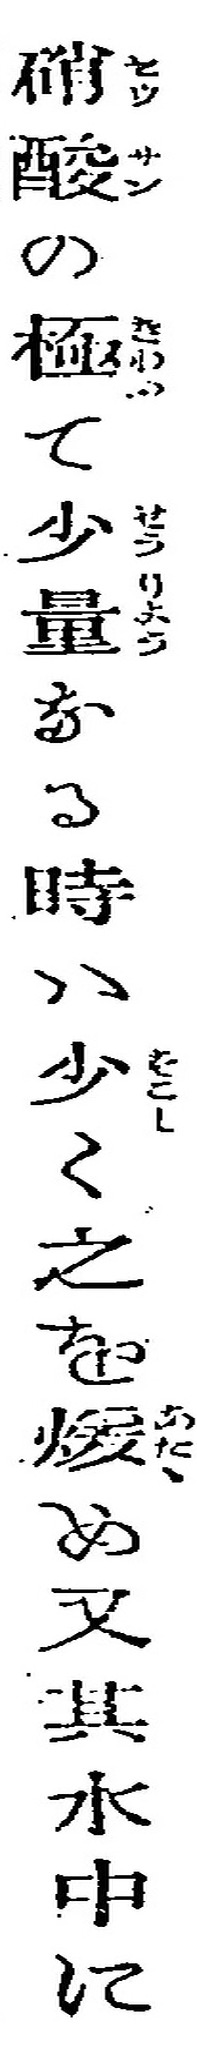硝酸の極て少量なる時は少く之を煖め又其水中に
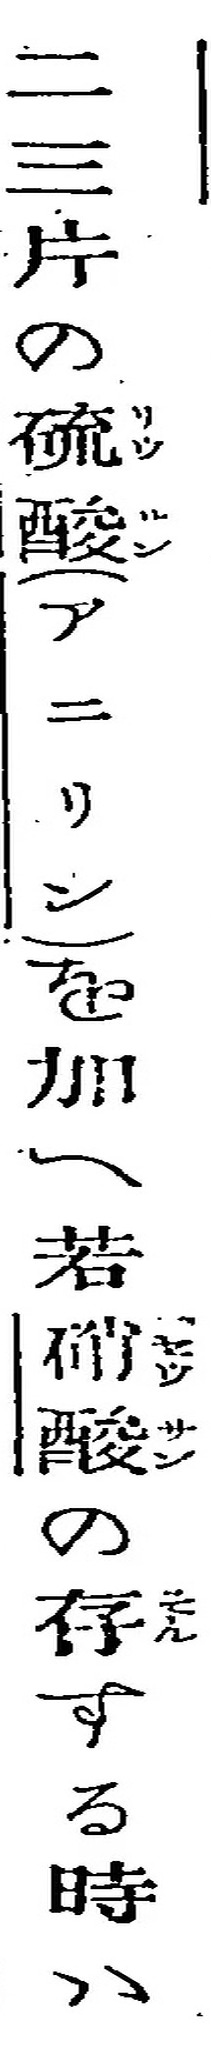二三片の硫酸[アニリン]を加へ若硝酸の存する時は
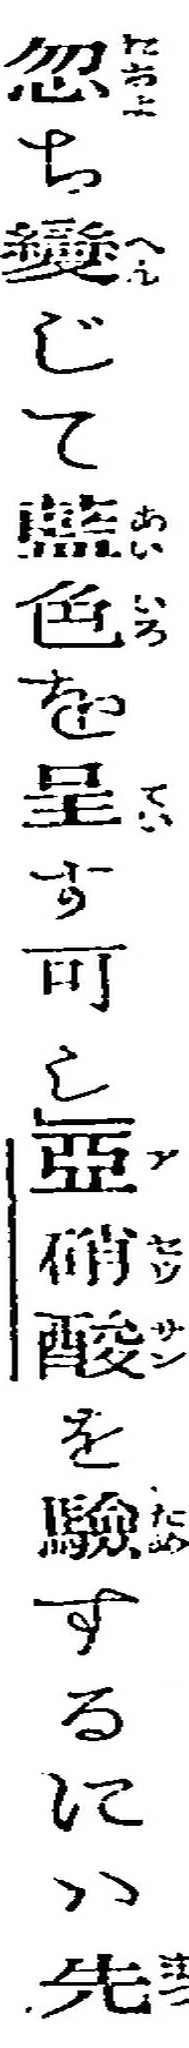忽ち變じて藍色を呈す可し」亞硝酸を験するには先
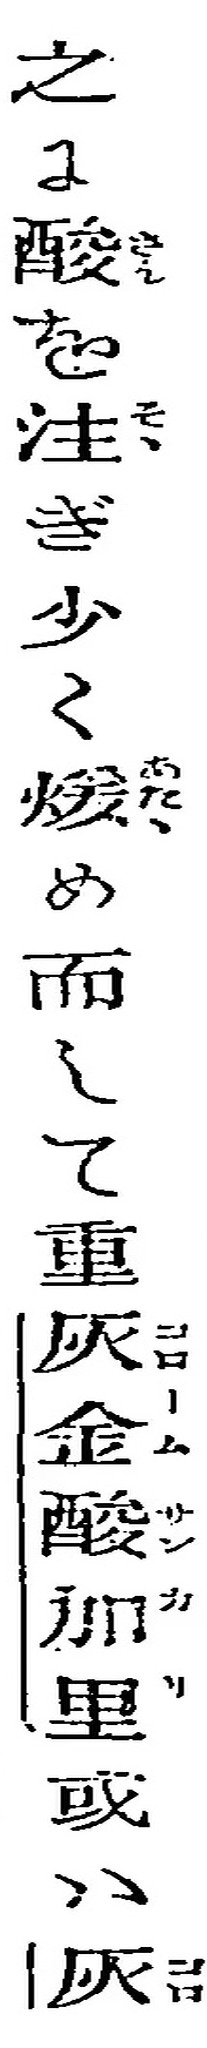之に酸を注ぎ少く煖め而して重灰金酸加里或は灰
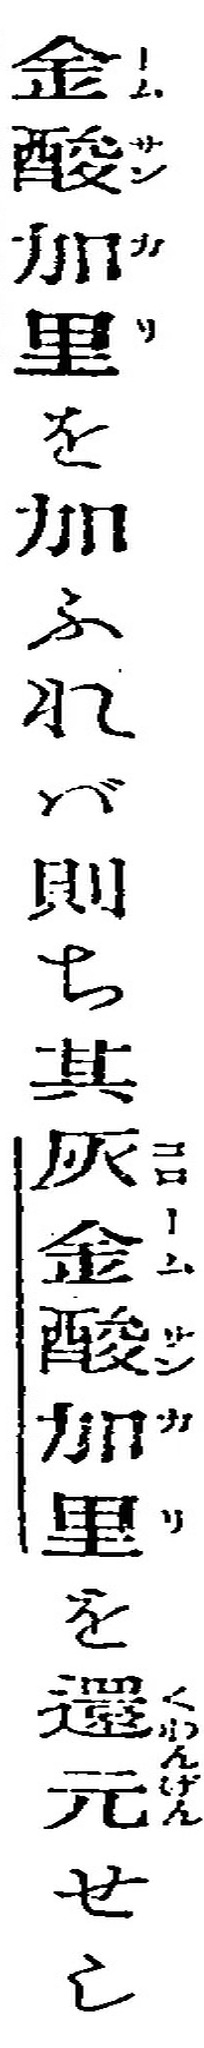金酸加里を加ふれば則ち其灰金酸加里を還元せし
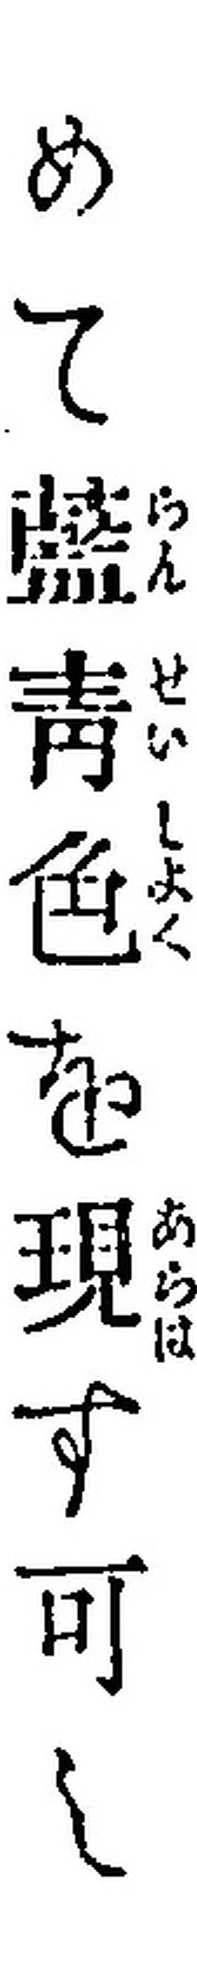めて藍青色を現す可し

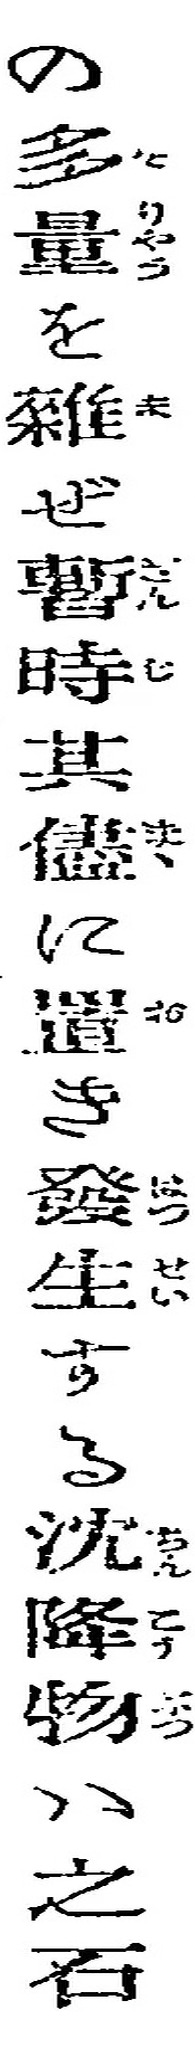の多量を雜ぜ暫時其儘に置き発生する沈降物は之石
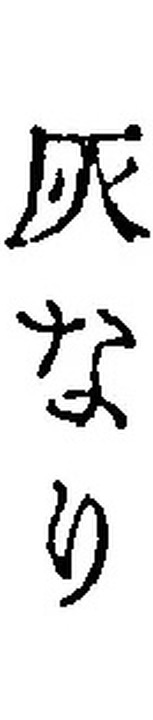灰なり
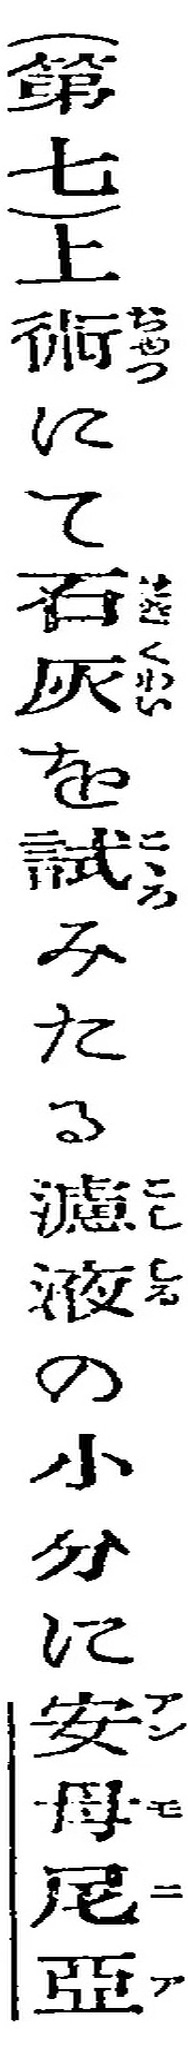[第七]上術にて石灰を試みたる濾液の小分に安母尼亞
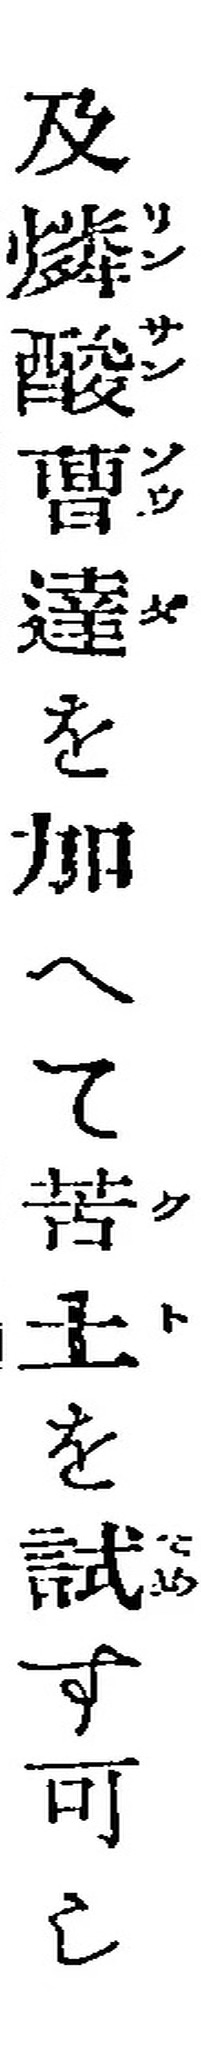及燐酸曹達を加へて苦土を試す可し
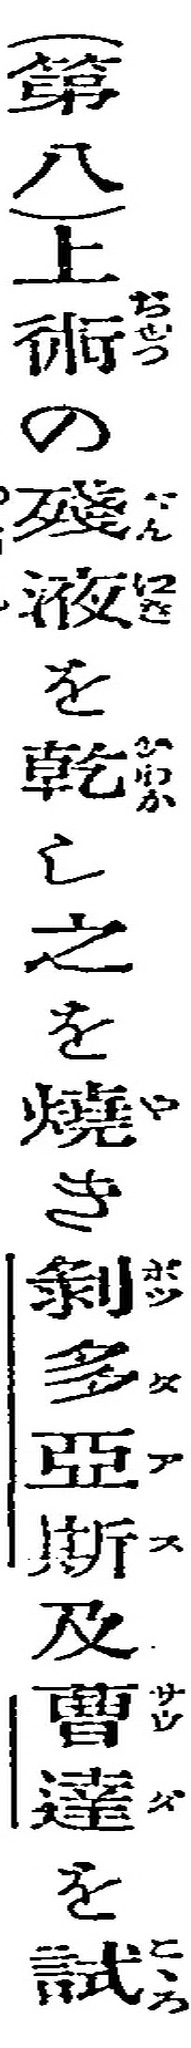[第八]上術の残液を乾し之を焼き剥多亞斯及曹達を試
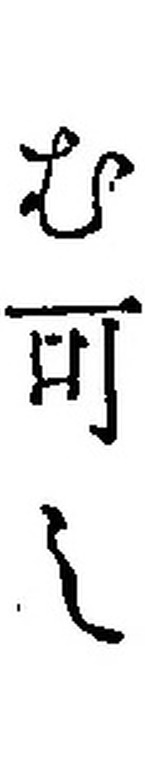む可し
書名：飲水の心得 : 伝染病の予防
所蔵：国立国会図書館 National Diet Library, JAPAN
